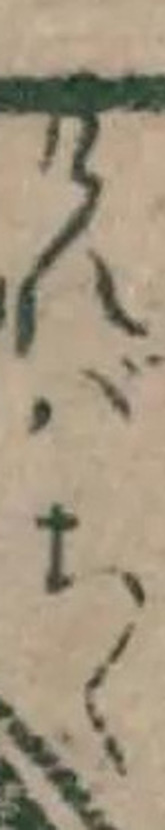ければちゝ
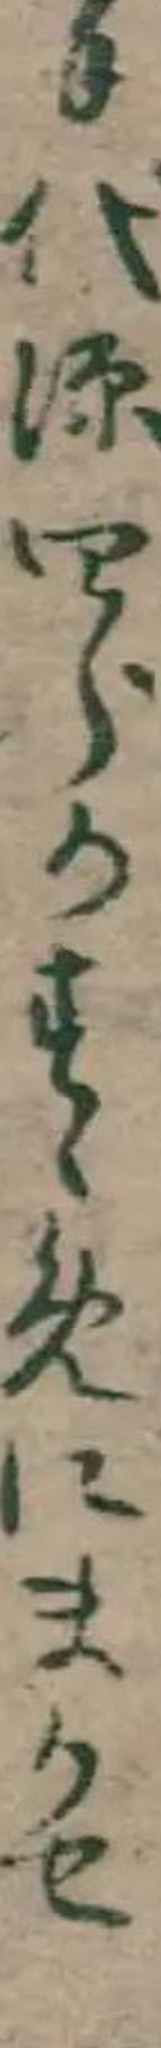手代源四郎かすゝめにまかせ
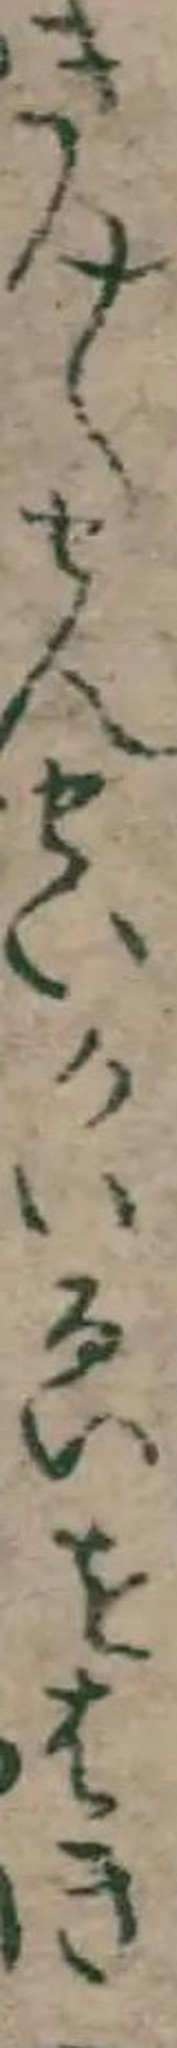きん〳〵せんせいかいるいをはき
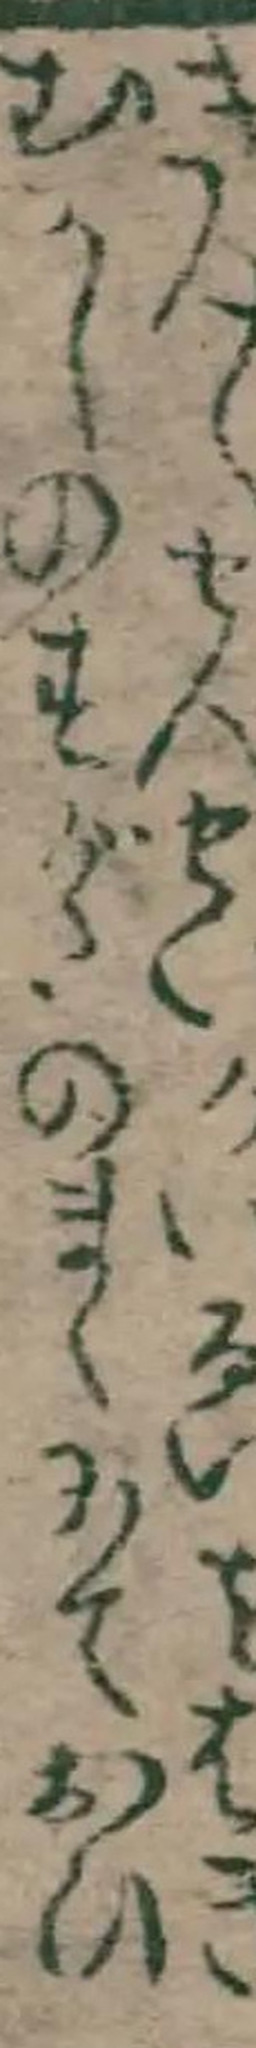むかしのすがたのまゝにておひ
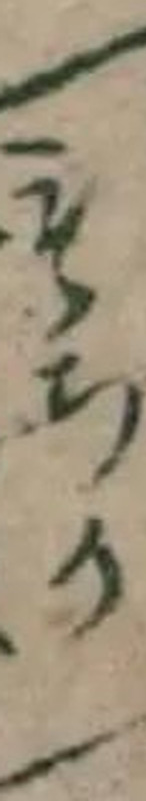もちか
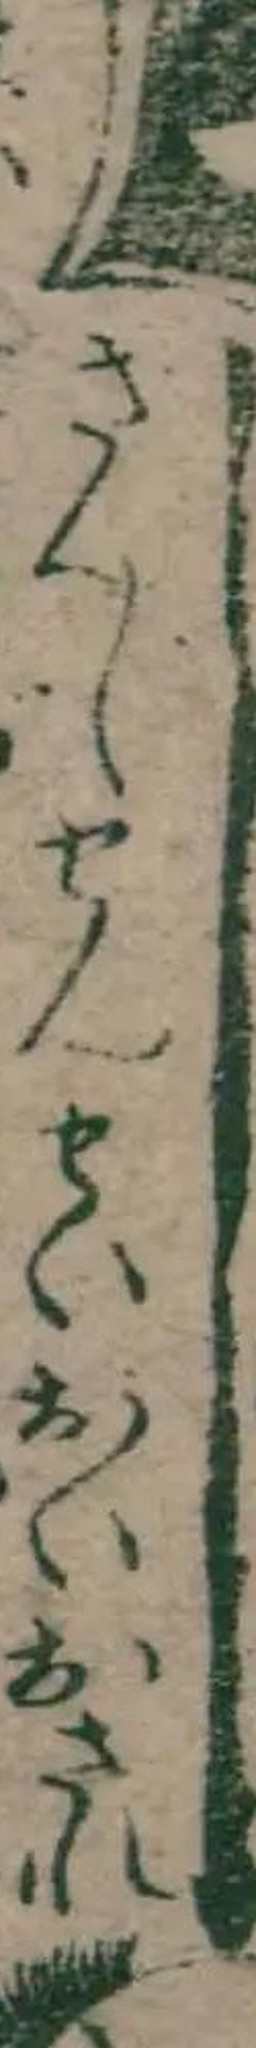きん〳〵せんせいおい出され
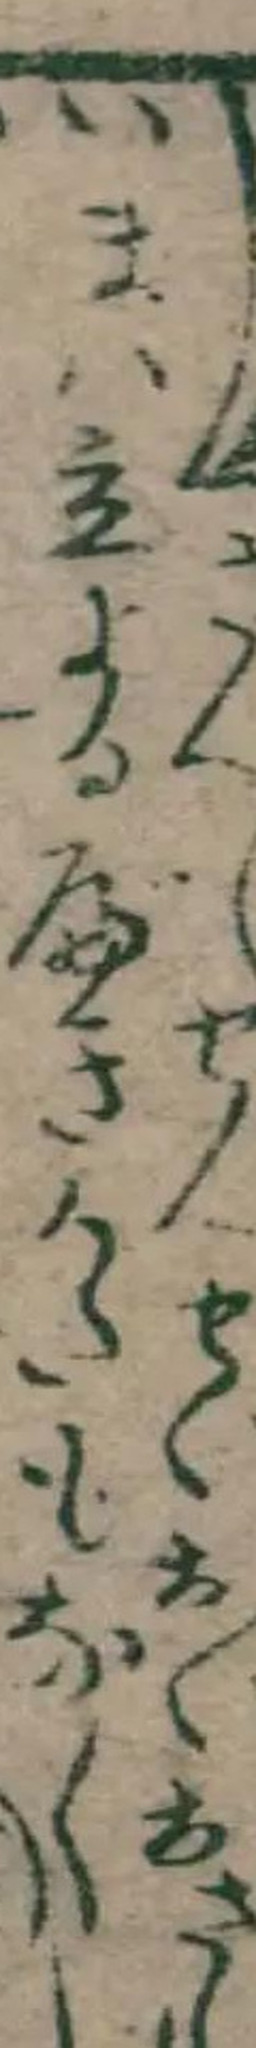いまは立よるべきかたもなく
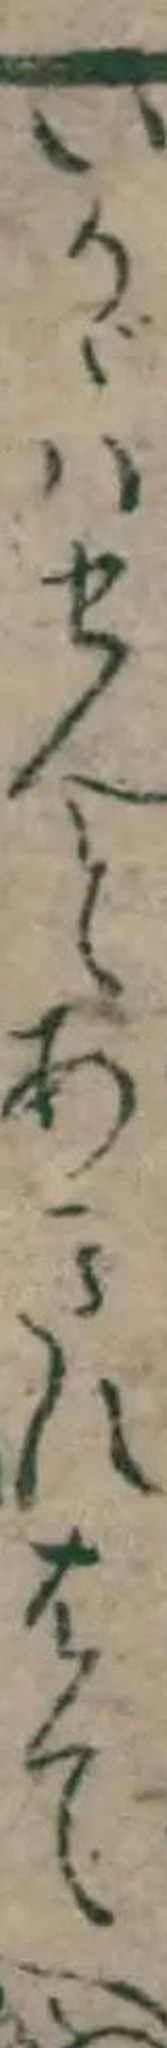いかゞはせんとあきれはて
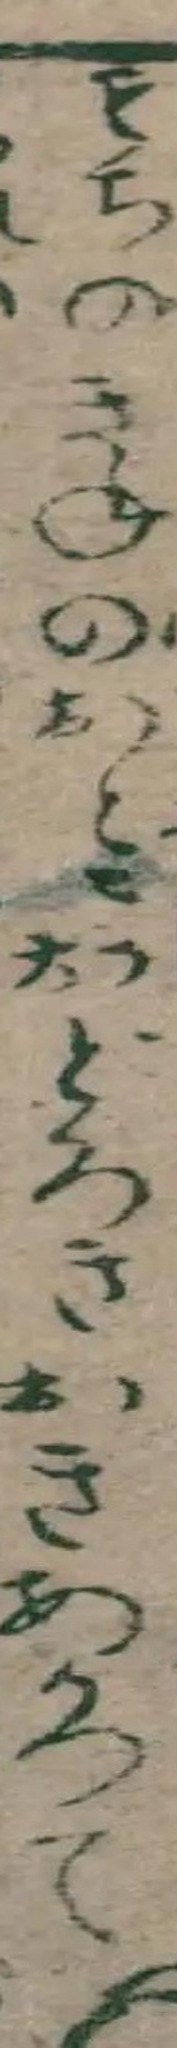もちのきねのおとにおとろきおきあがつて
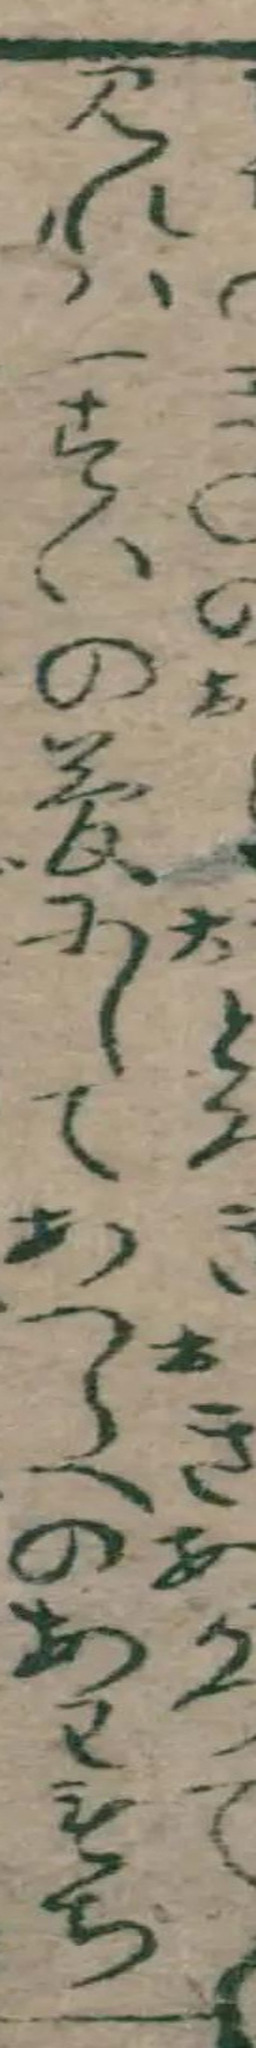見れは一すいの夢にしてあつらへのあわもち
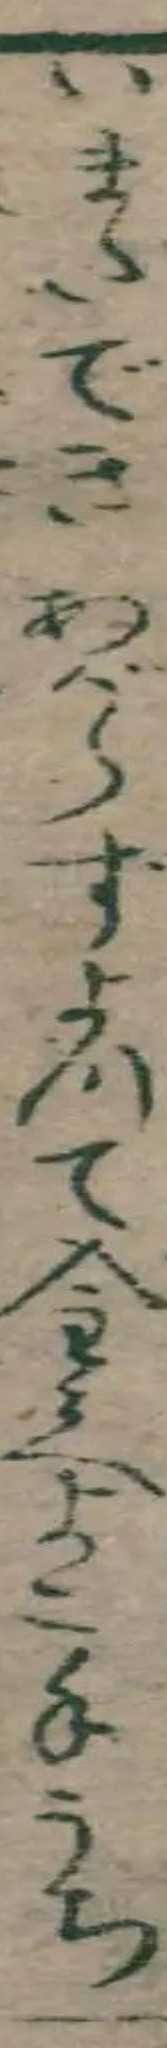いまたできあがらずよつて金兵へよこ手うち
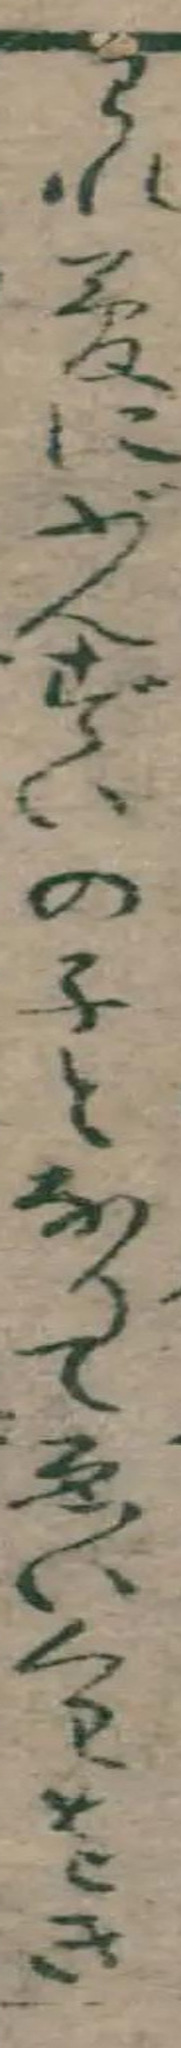われ夢にぶんずいの子となりてゑいくわをき
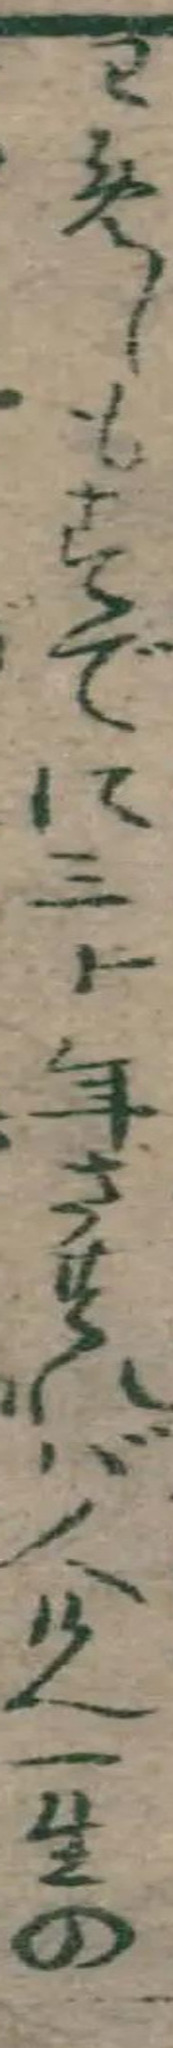わめしもすでに三十年さすれば人けん一生の
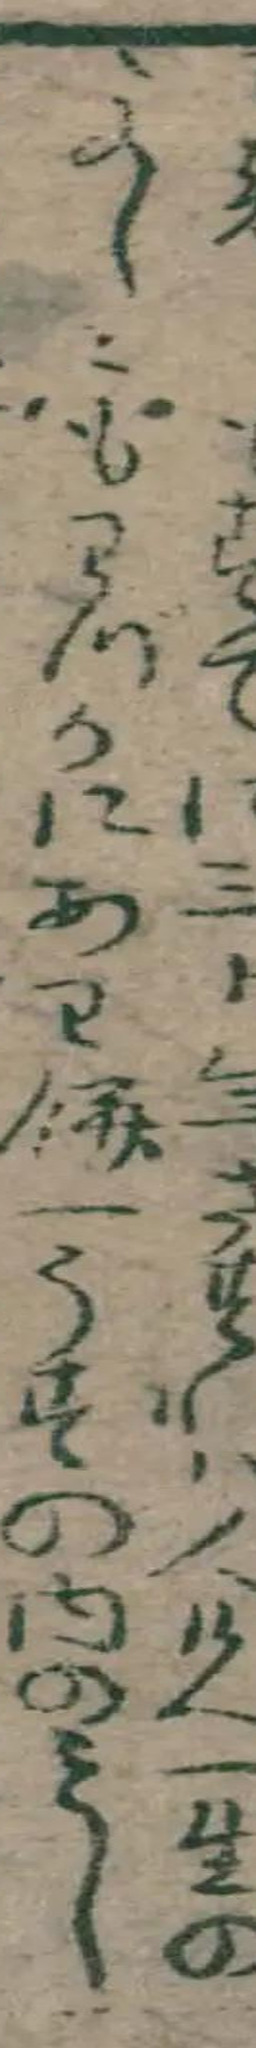たのしみもわづかにあわ餅一うすの内のことし
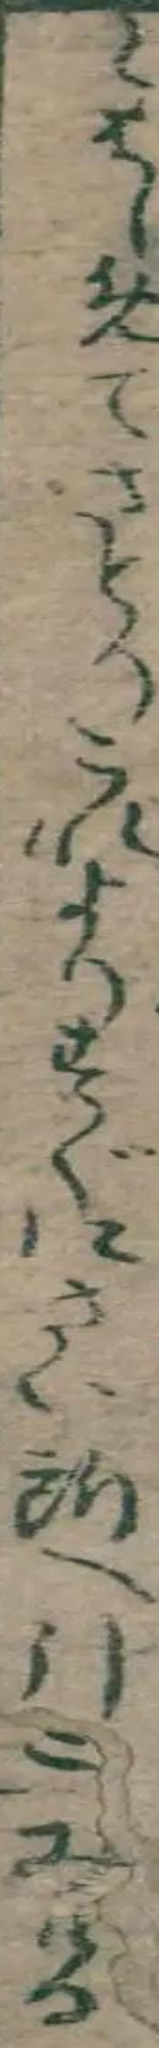とはしめてさとりこれよりすぐにさい所へ引こみける

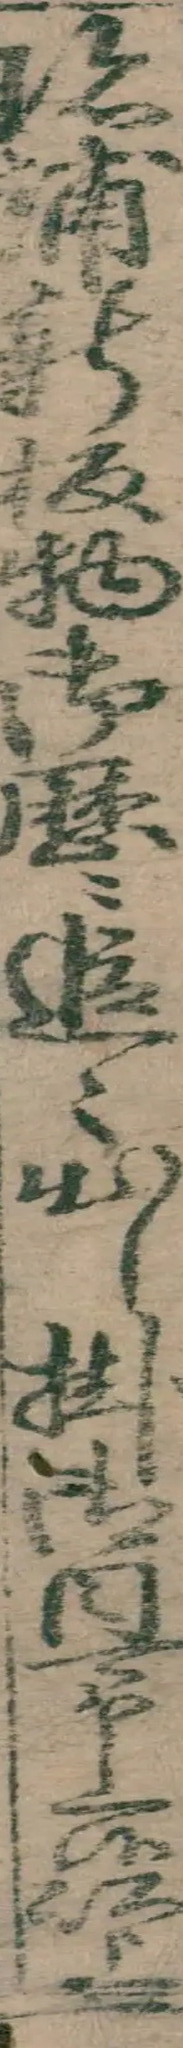珍舖新板物御歴々追々出し掛御目可申上候以上
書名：金々先生栄花夢 : 2巻
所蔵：国立国会図書館 National Diet Library, JAPAN
